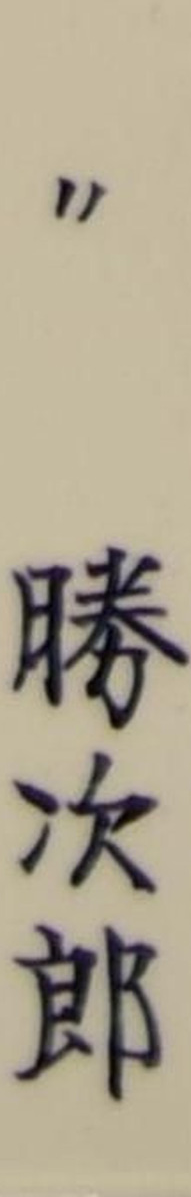勝次郎
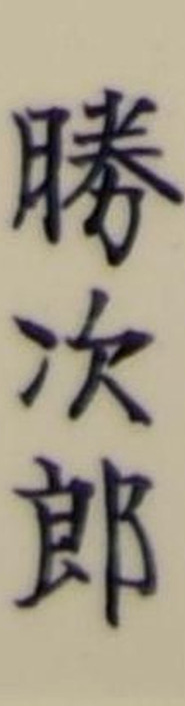勝次郎
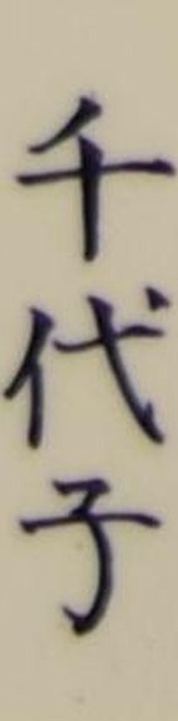千代子
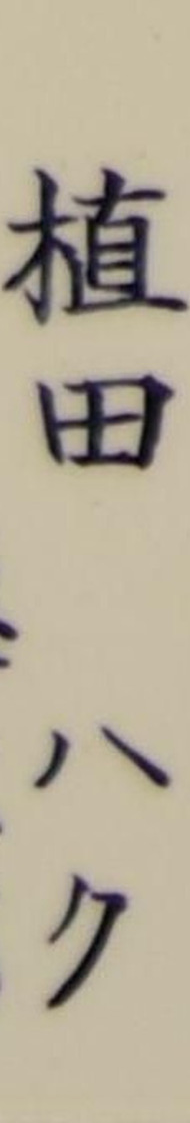植田ハク
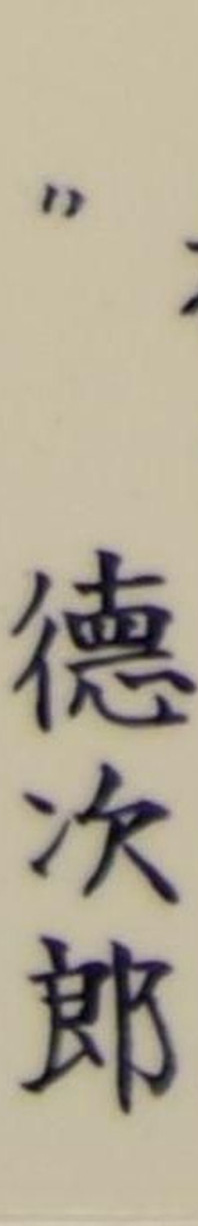徳次郎
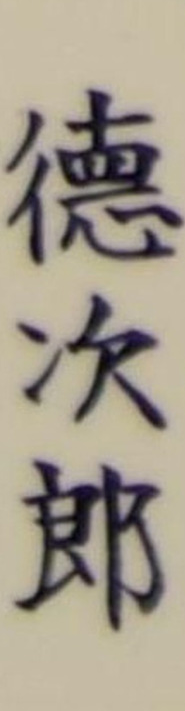徳次郎
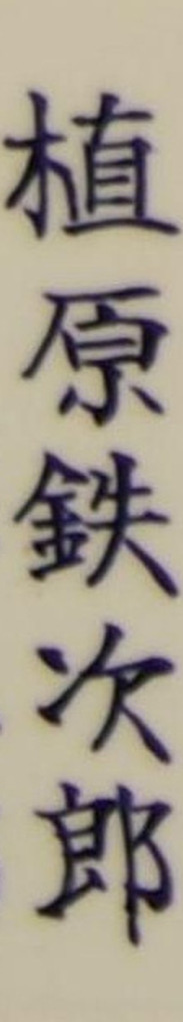植原鉄次郎
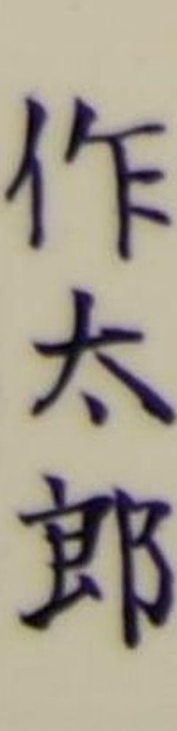作太郎

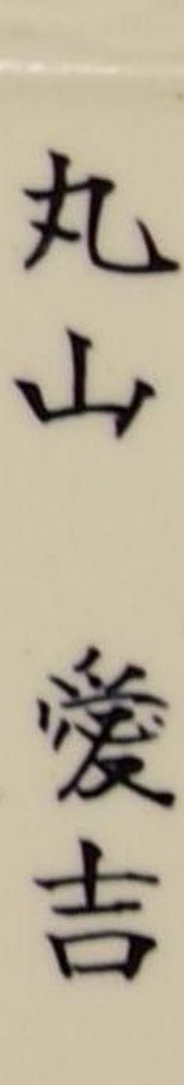丸山愛吉
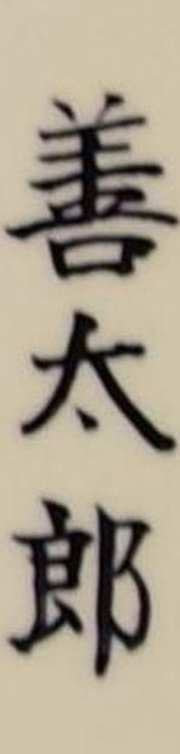善太郎
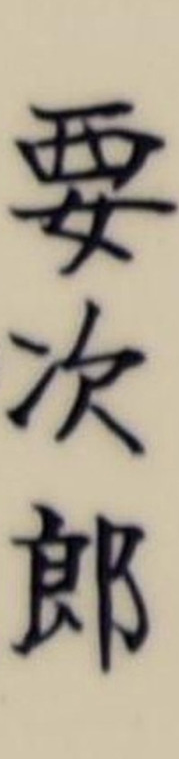要次郎

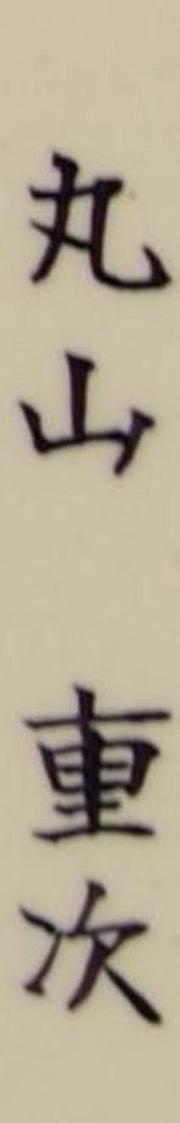丸山重次
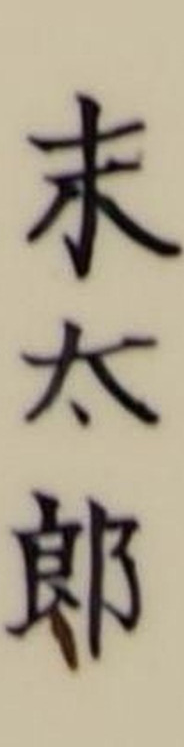末太郎
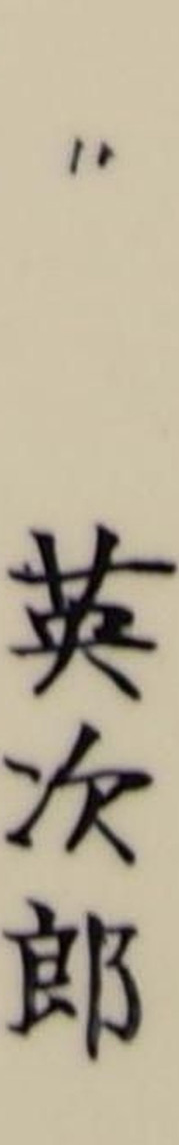英次郎
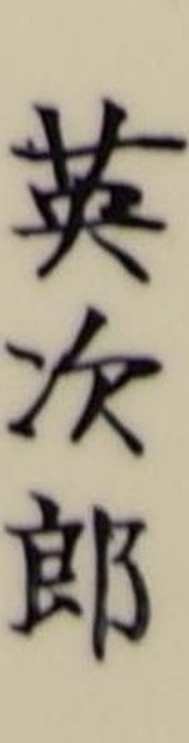英次郎
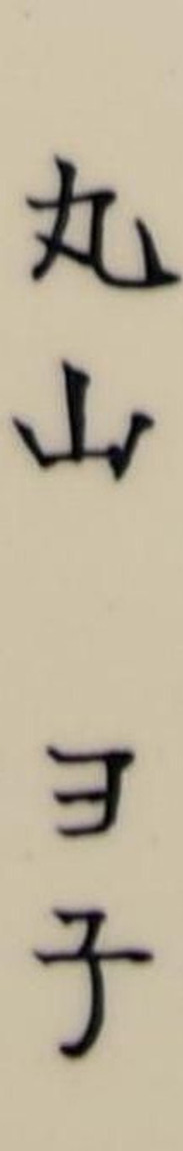丸山ヨ子
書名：A~D
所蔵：koyasan kongobuji
